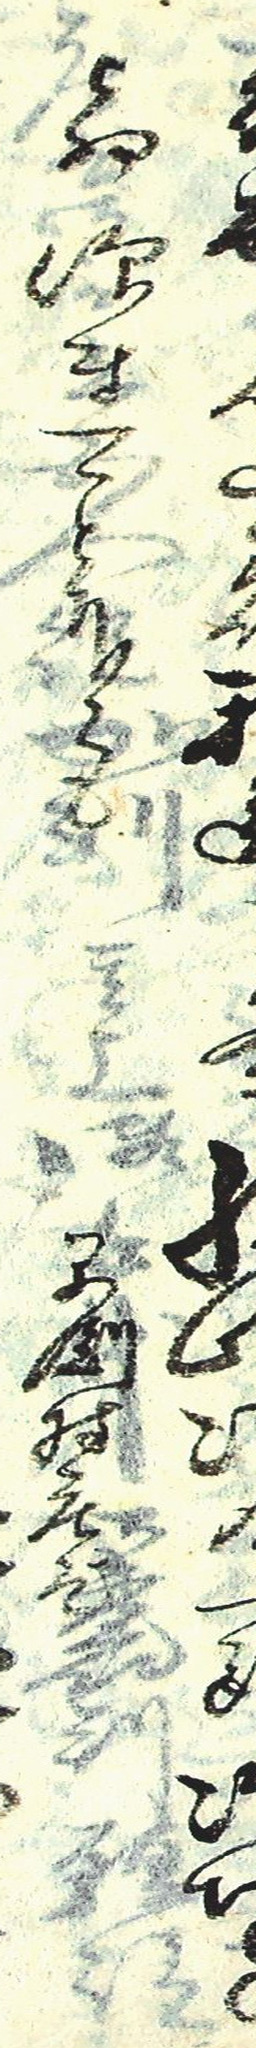被為仰付可被下候以上早淵村庄屋
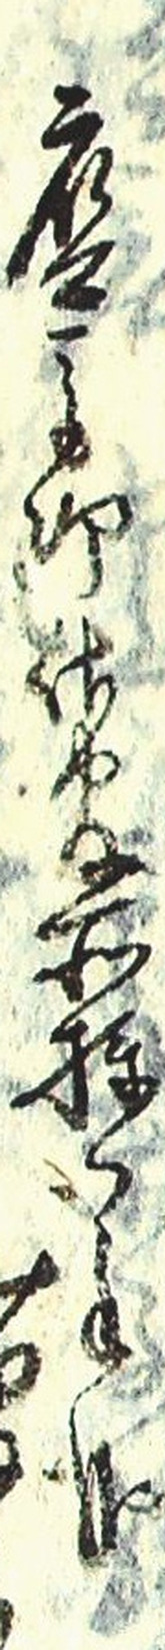藍方御代官所様御手代
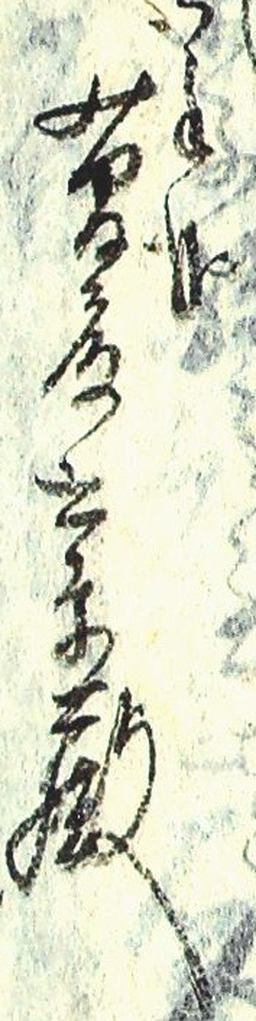菅藤六兵衛殿

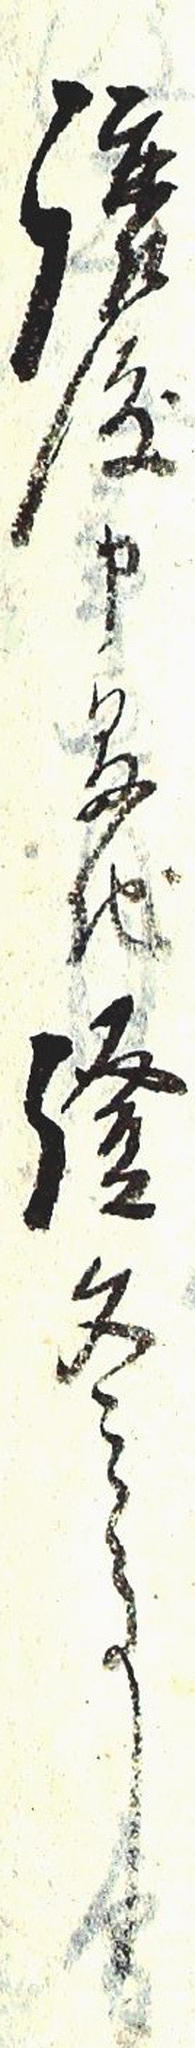譲渡申畠地証文之事
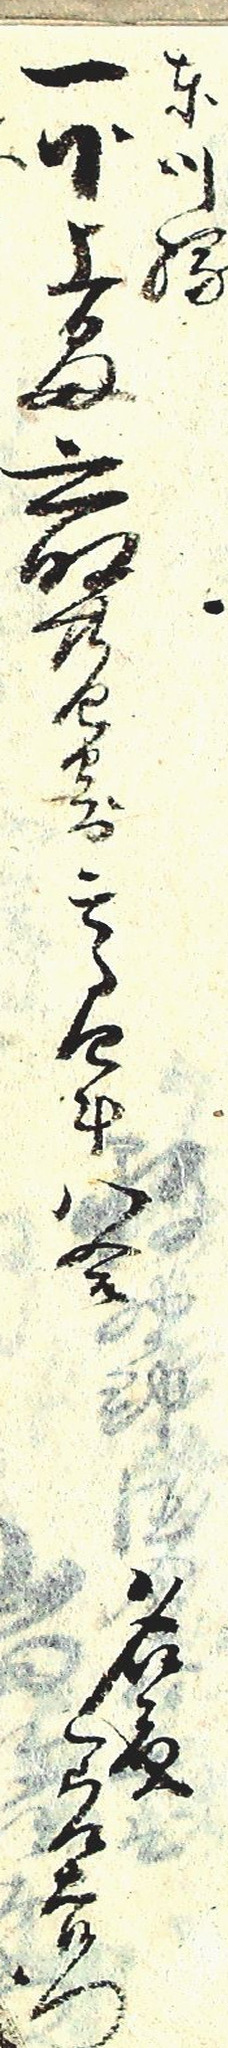一下上畠六畝廿四歩高四斗八合善右衛門
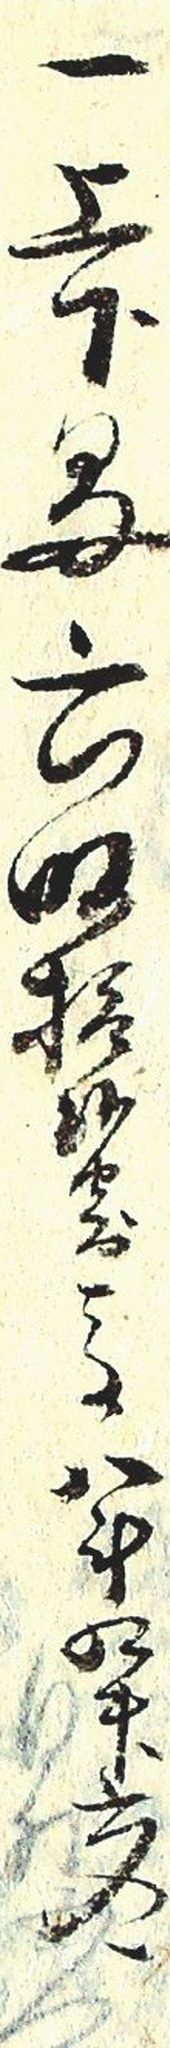一上下畠六畝拾弐歩高八斗九升六合同人
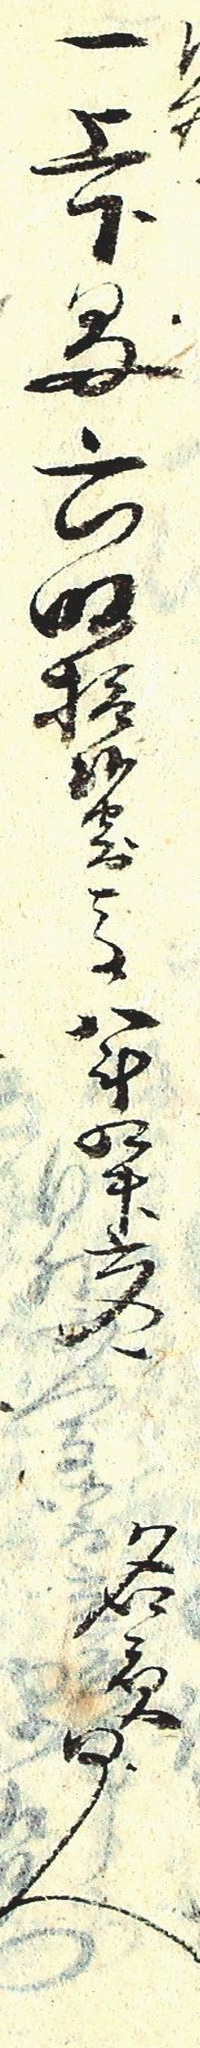一上下畠六畝拾弐歩高八斗九升六合同人
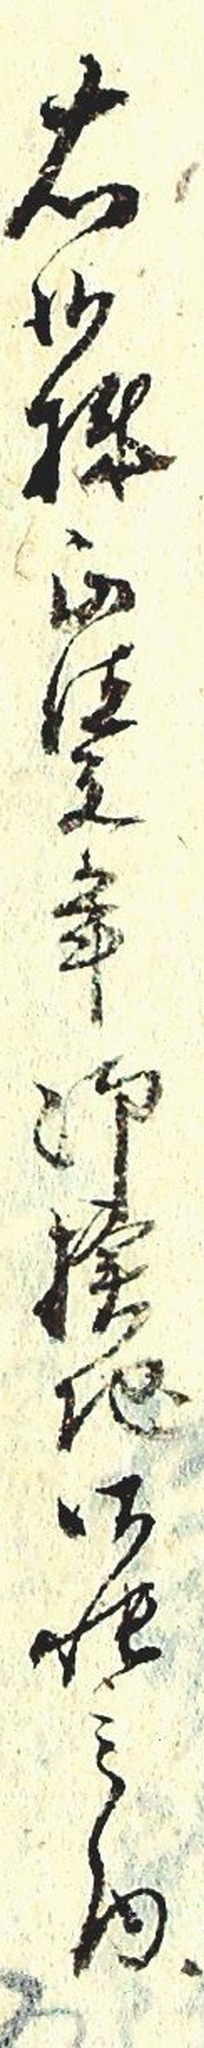右弐株正徳元年御検地御帳之内
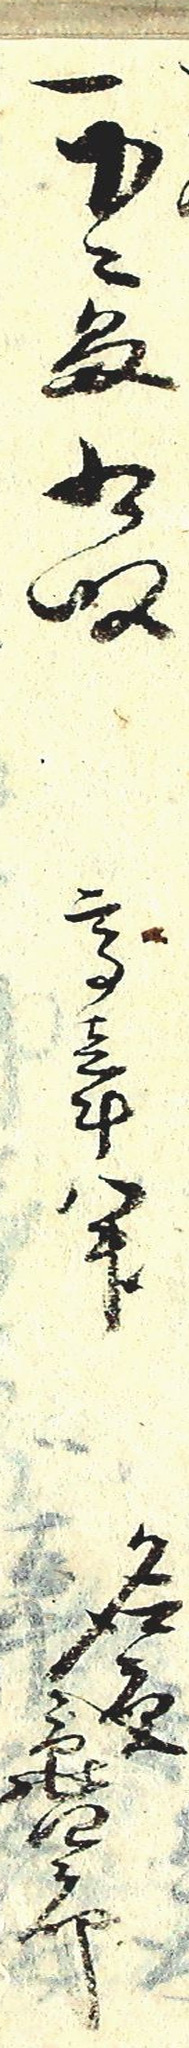一下々畠九畝高壱斗八升亀四郎
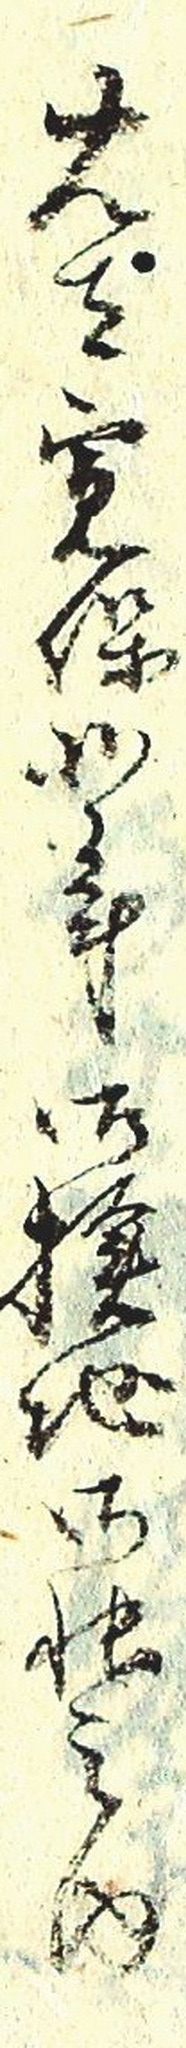右は寛保弍年御検地御帳之内
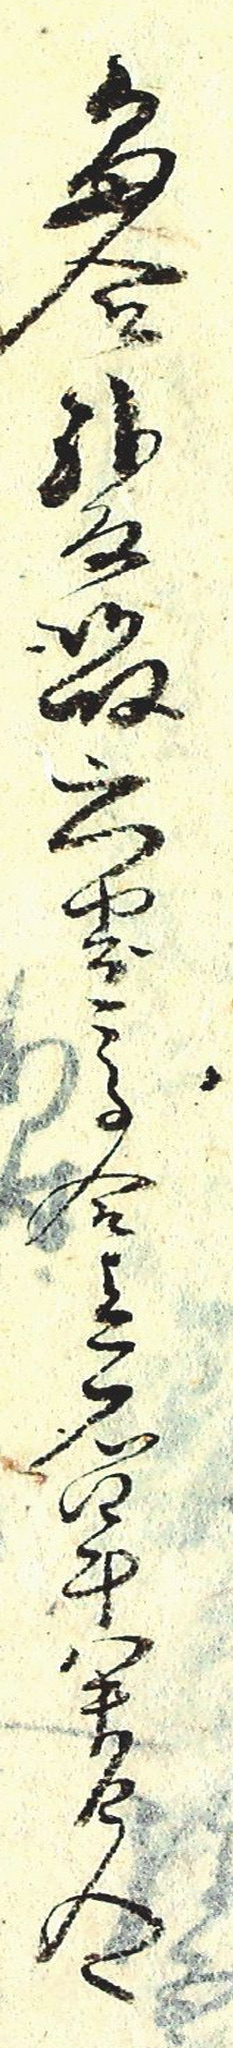畠合弐反弐畝六歩高合壱石四斗八升四合
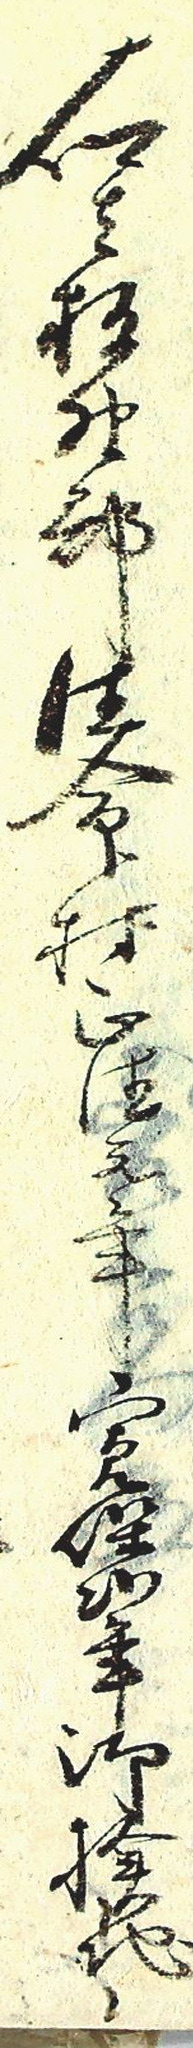右は板野郡徳命村正徳元年寛保弍年御検地
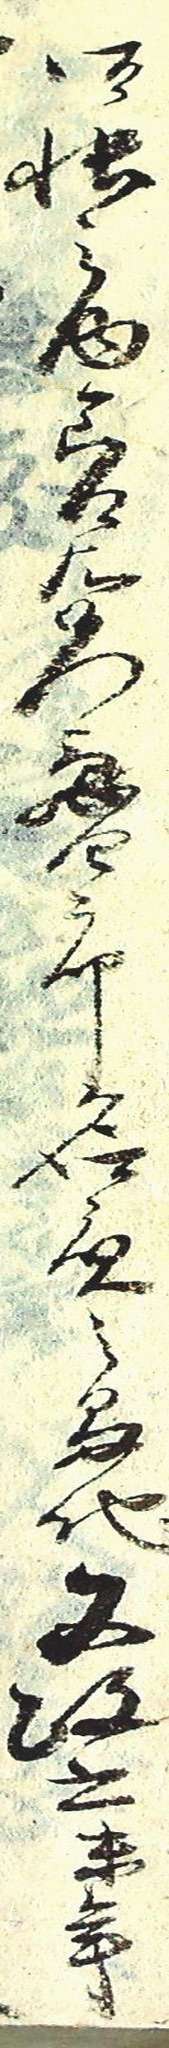御帳之内善右衛門亀四郎名負之畠地文政六未年
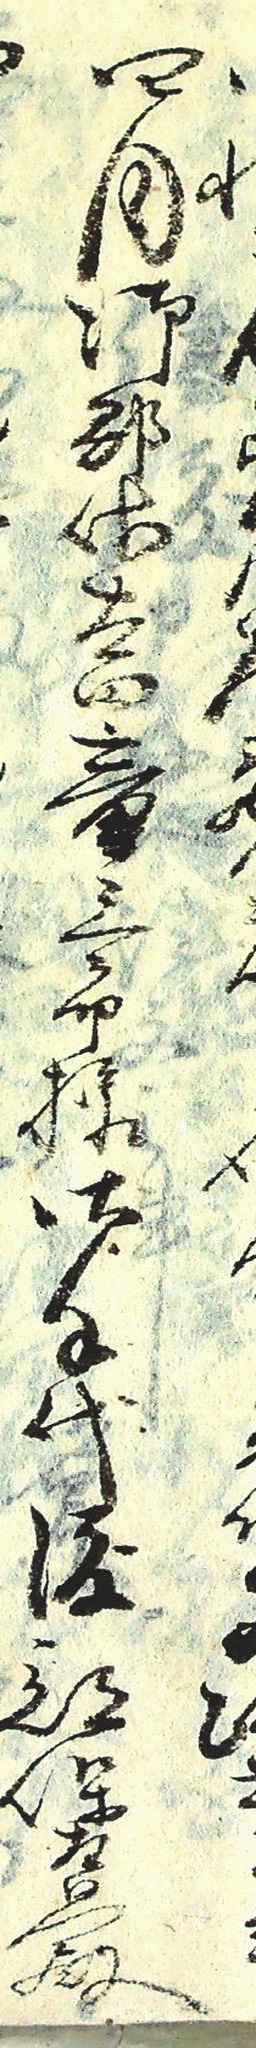四月御郡代太田童三郎様御手代渡部保左衛門殿
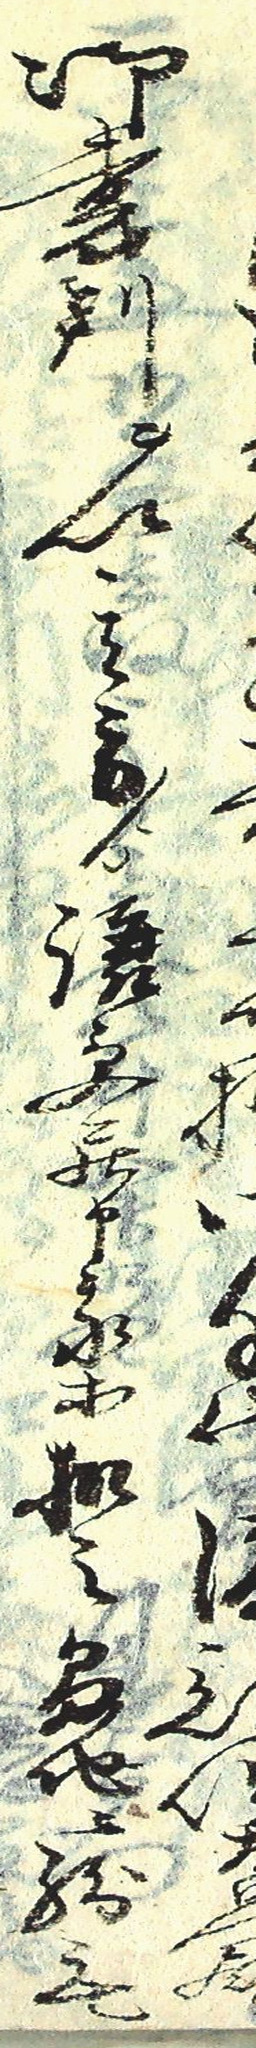御裏判を以其方ゟ譲受居申我等扣之畠地に紛無
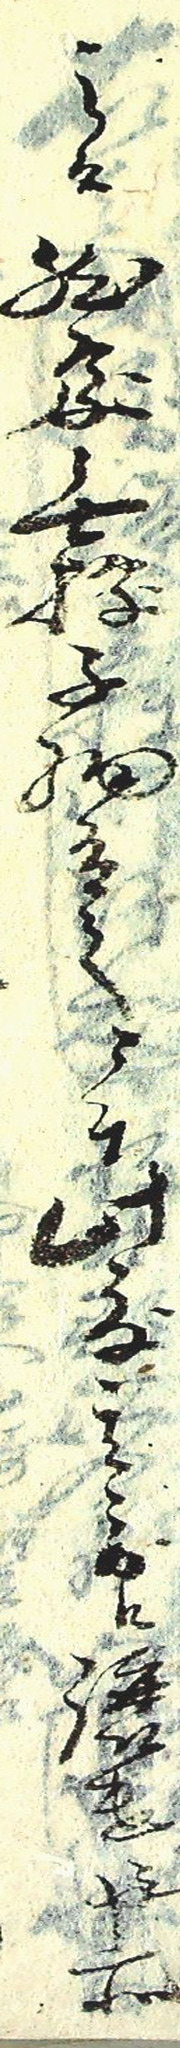之候然処無拠子細有之に付此度其方え譲遣し申所
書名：諸御願書控(弐番）
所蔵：鳴門教育大学 Naruto University of Education
